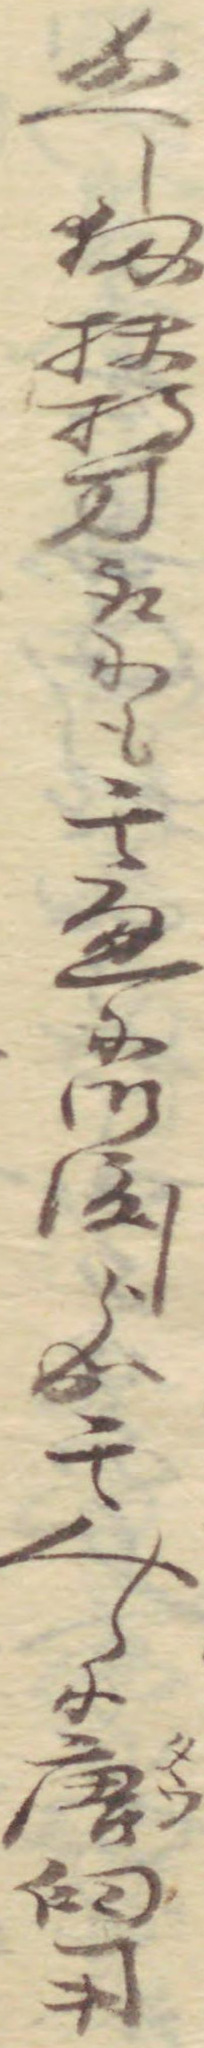成へし扨扶持方取にも其通に御渡し被成其人〳〵に唐臼用
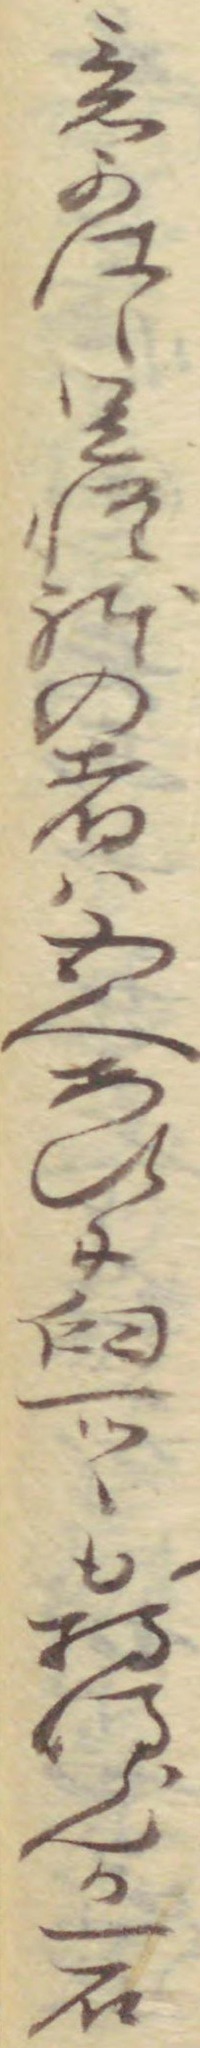意可仕候足軽体の者は五人あひに臼一ツヽも持侍らんか一石
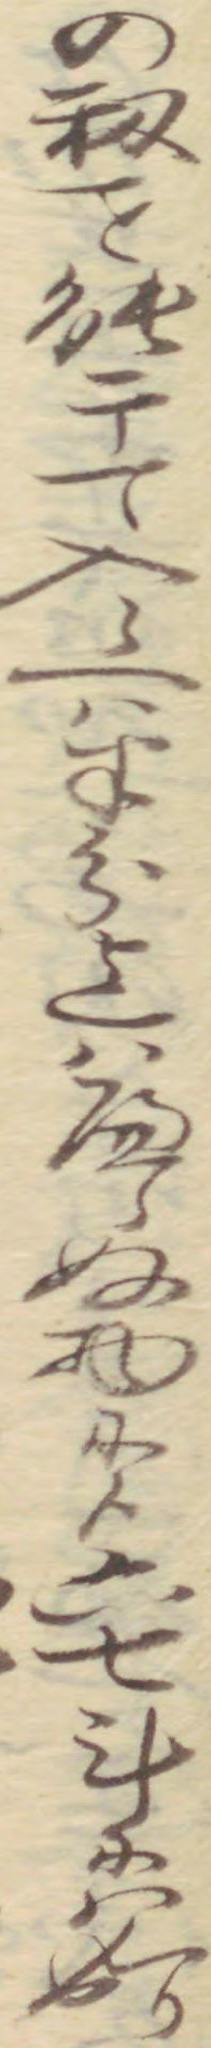の籾を能干て入候へは半分迄はへらぬ物に候六七斗には成り
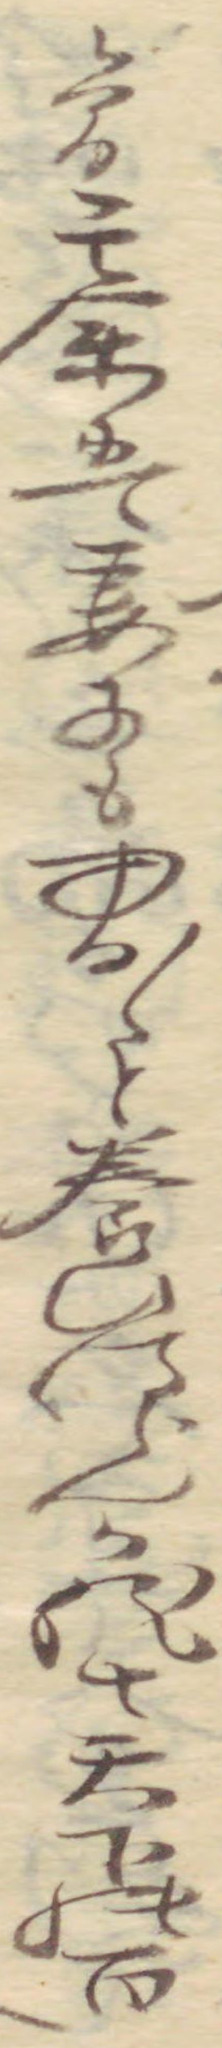候間其余にて妻子もゆる〳〵と養ひ侍らんか然は天下の百
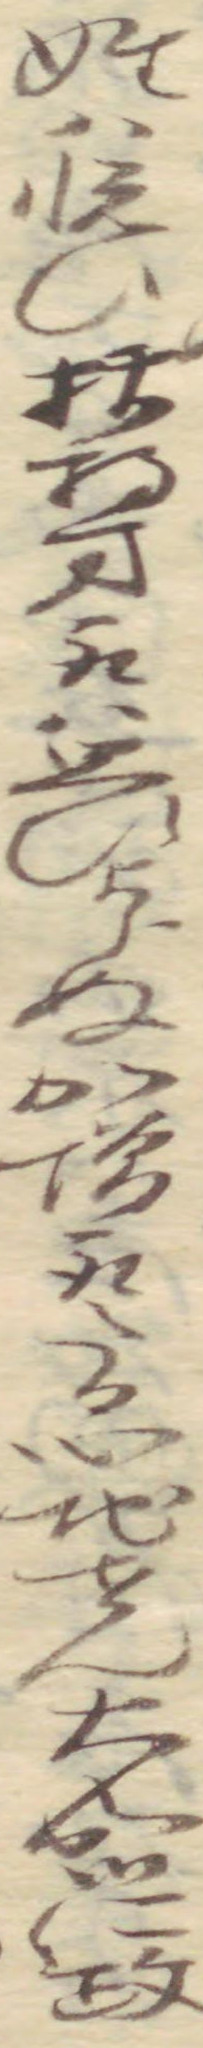姓は悦ひ扶持方取は思ひよらぬ加増取たる心地せん大成御仁政
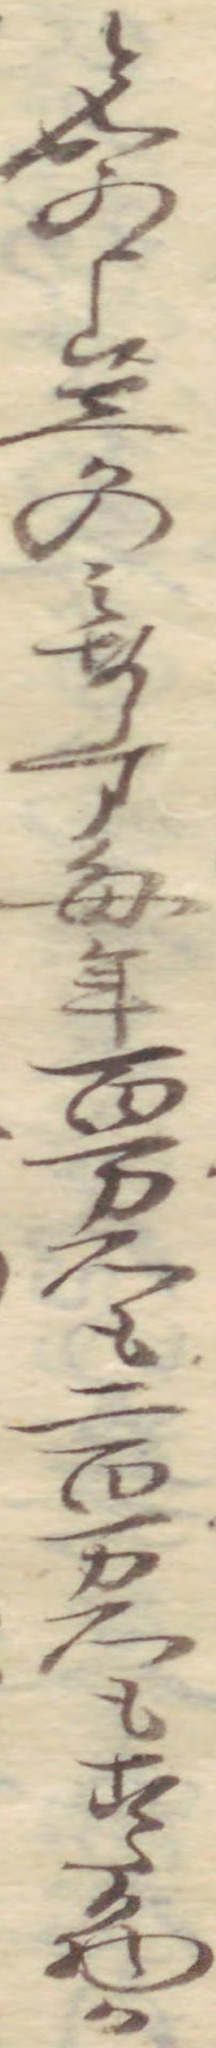と成可申候しかのみならす毎年百万石も二百万石もすたる物か
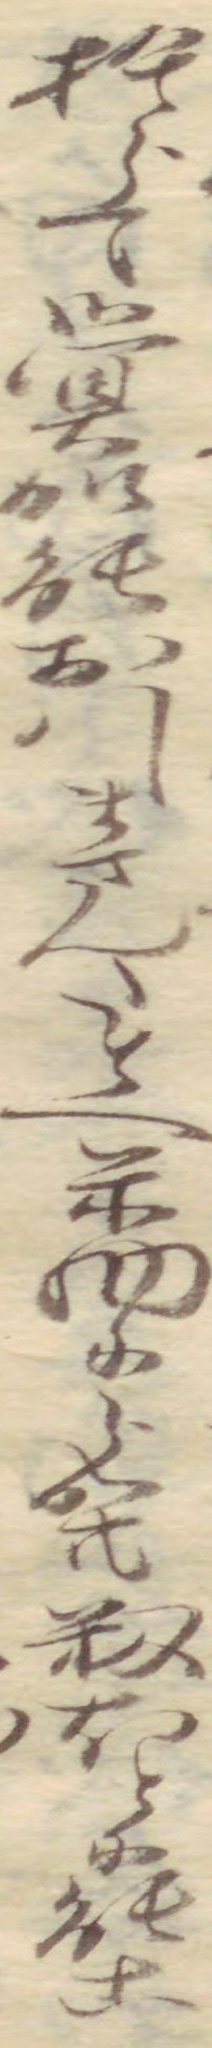捨らて御冥加能おはしまさんたとへ米納に被成共籾ほとに能こ
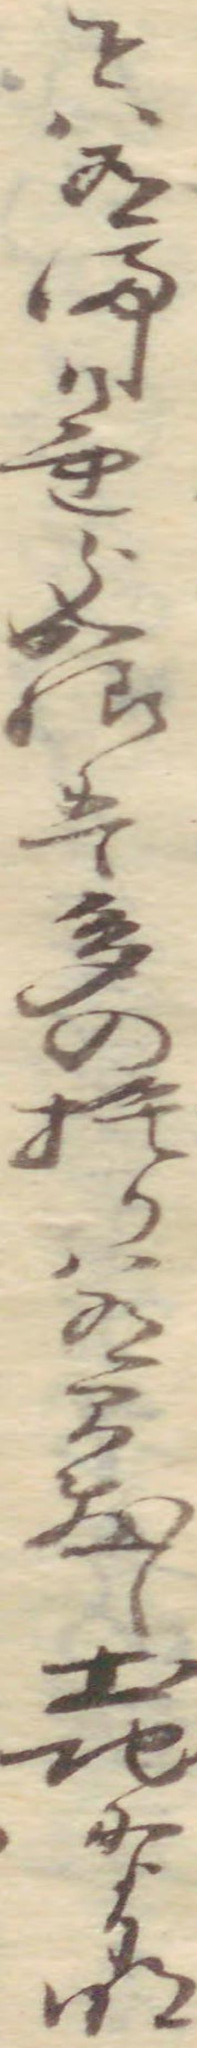そは有ましけれ被成様にて多の捨りは有間鋪候土地により明
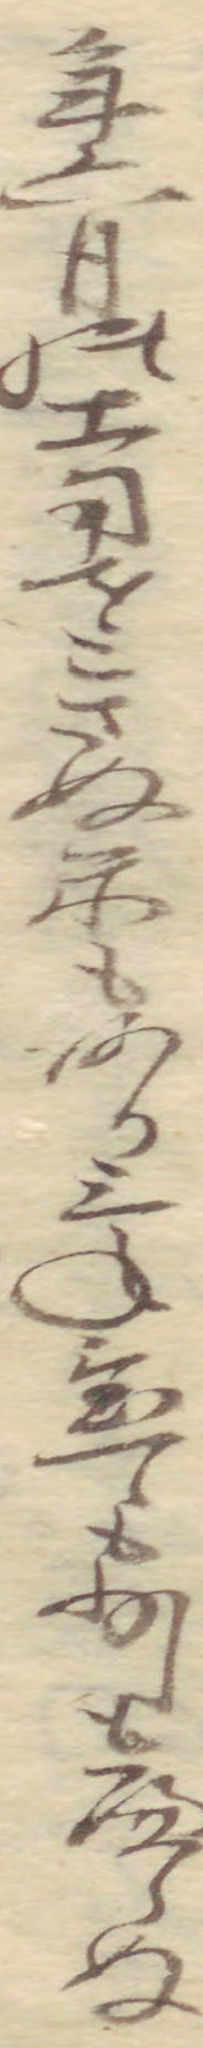年六月の土用をこさぬ米もあり三年置ても少しもへらぬ
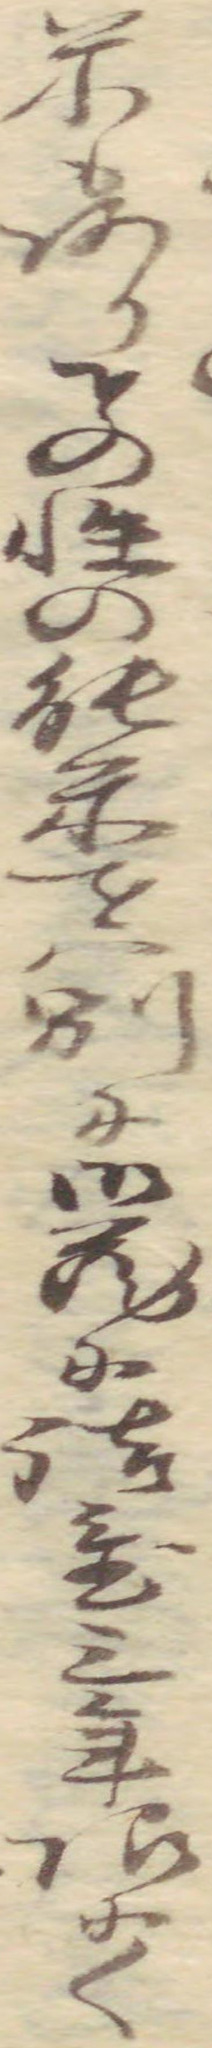米も有その性の能米をは別に御蔵に詰置三年限にく
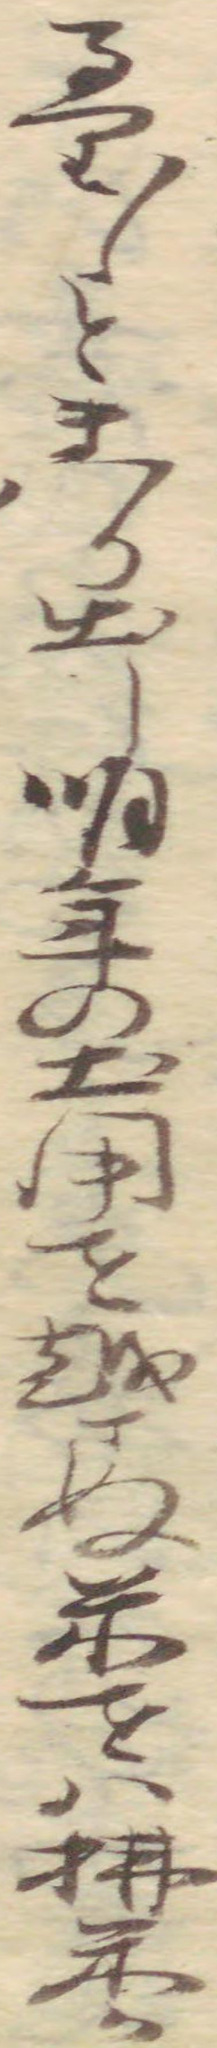るり〳〵とまはり出し明年の土用を越さぬ米をは仏米か
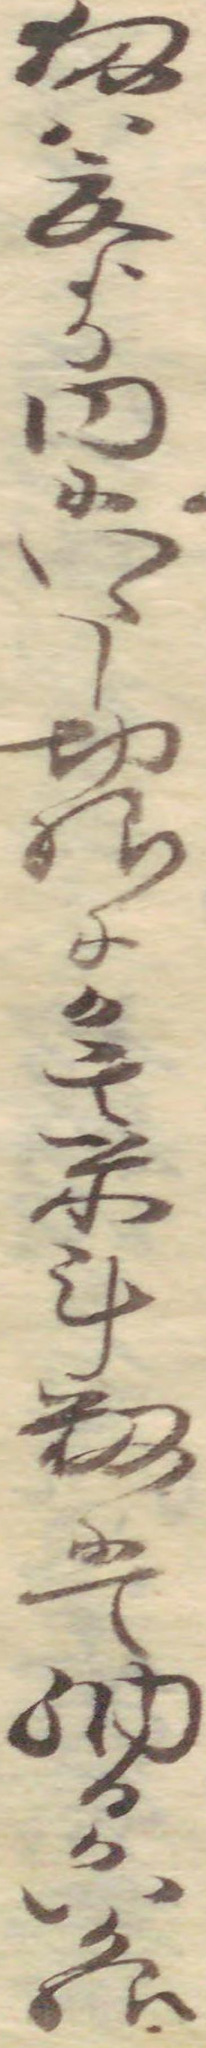扨は夏より内にいたし切様にか其米計籾にて納るかいか様
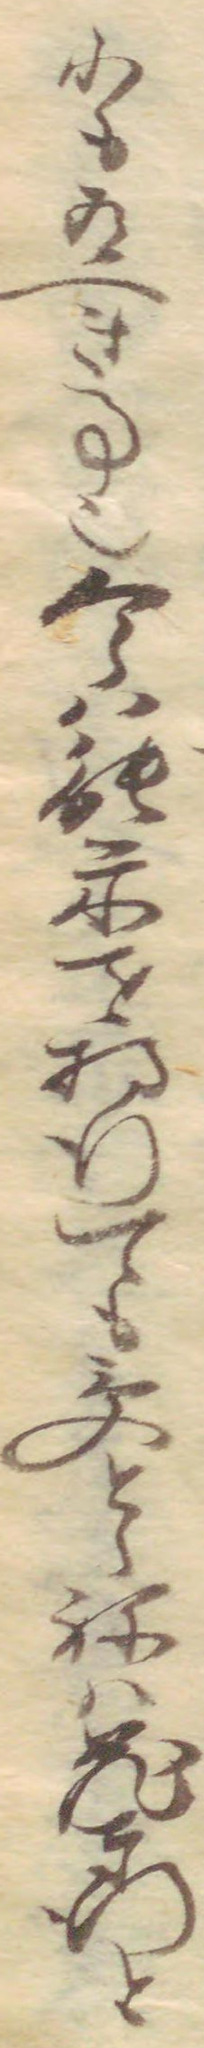にも有へき事也今は能米を持行ても受とらねは蔵奉行と

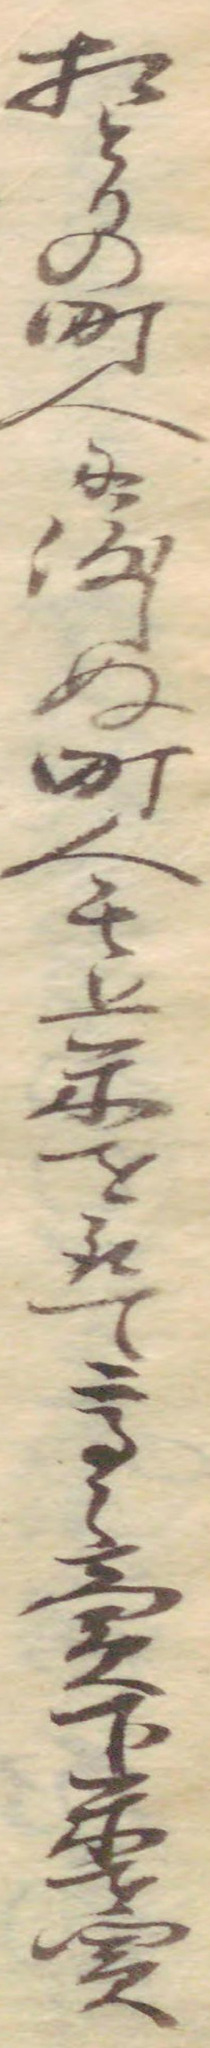相とりの町人に渡しぬ町人其上米を取て高く売下米を買
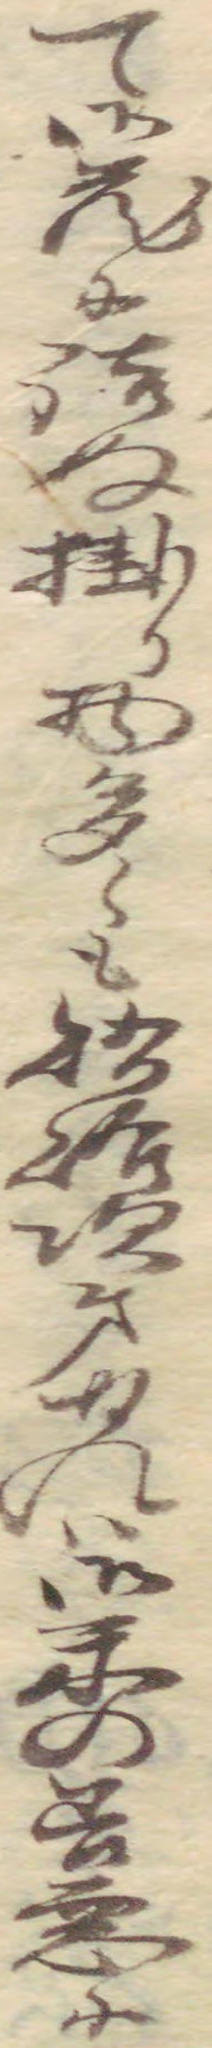て御蔵に詰ぬ掛り物多くも賄賂次第なれは御米の善悪に
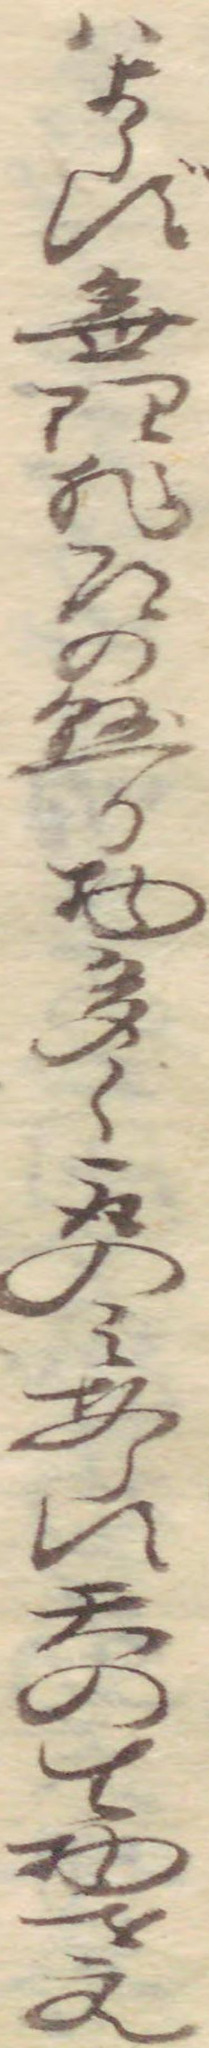はよらず無理非道の懸り物多く取のみならす天の生物を空
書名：鶯宿雑記. 巻263-264
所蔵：国立国会図書館 National Diet Library, JAPAN
